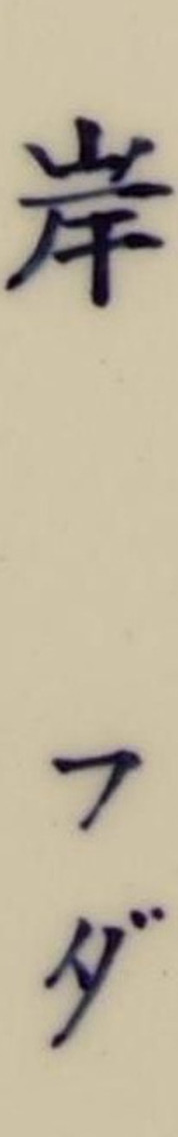岸フダ
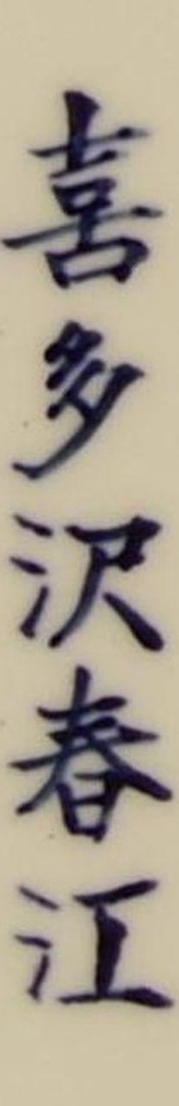喜多沢春江
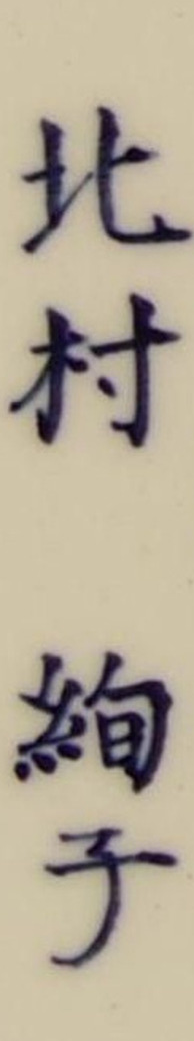北村絢子
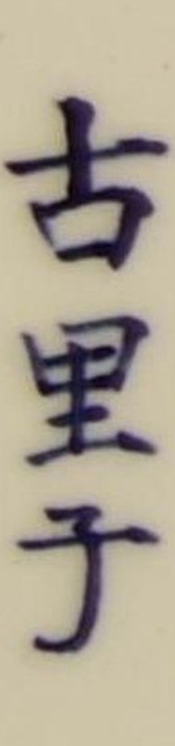古里子

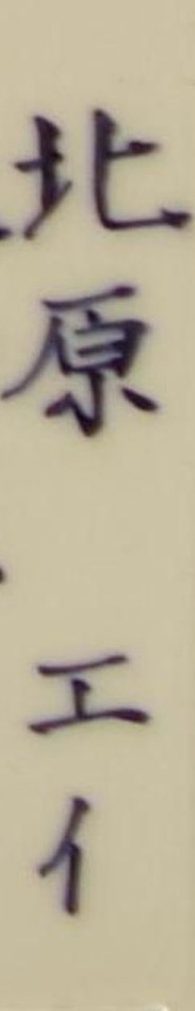北原エイ
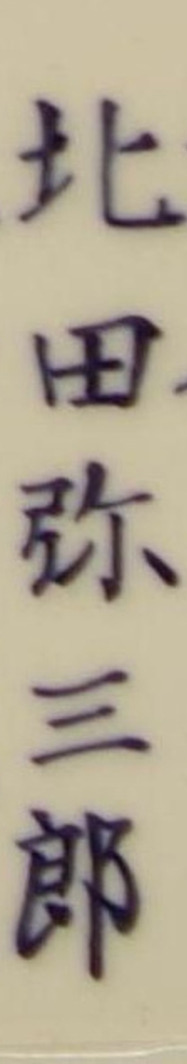北田弥三郎
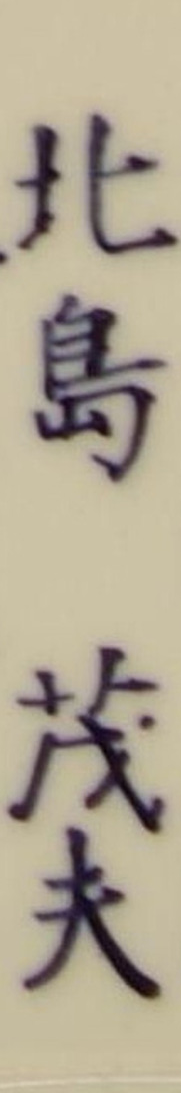北島茂夫
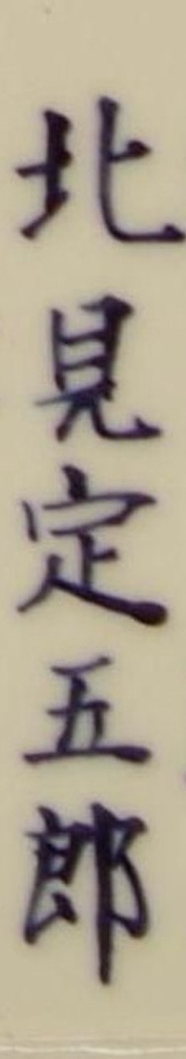北見定五郎
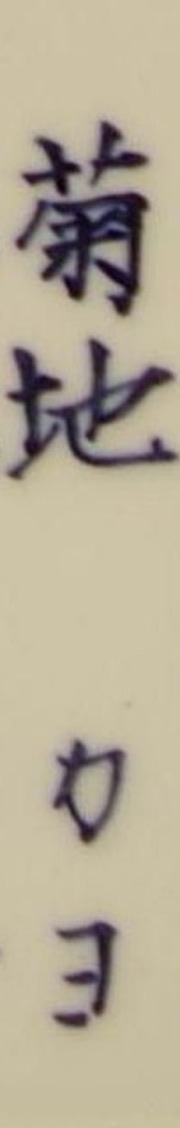菊地カヨ
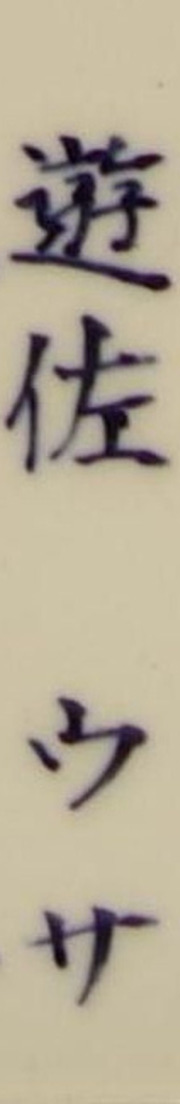遊佐ウサ
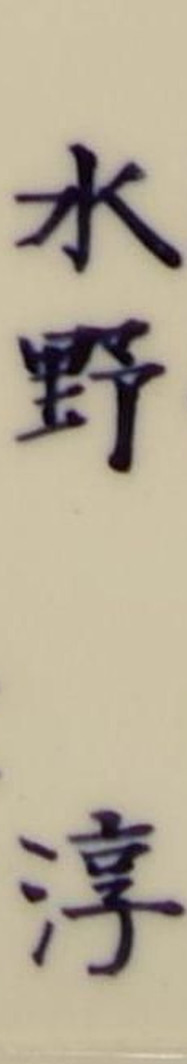水野淳
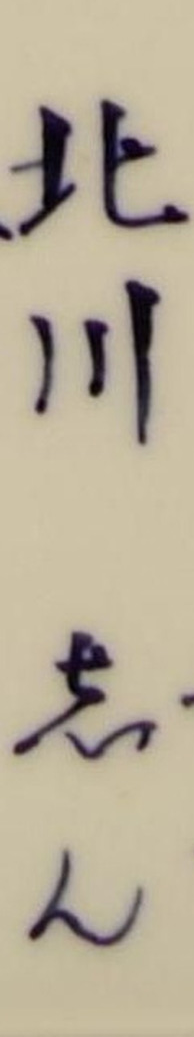北川しん
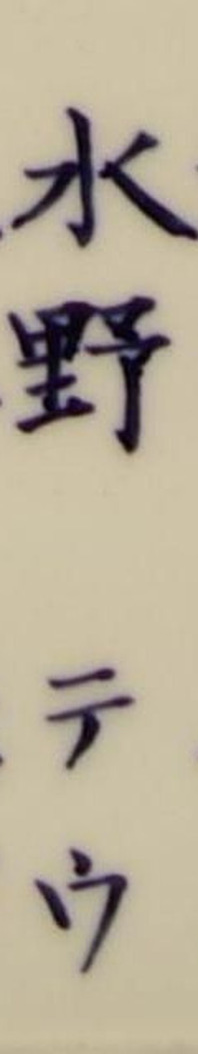水野テウ
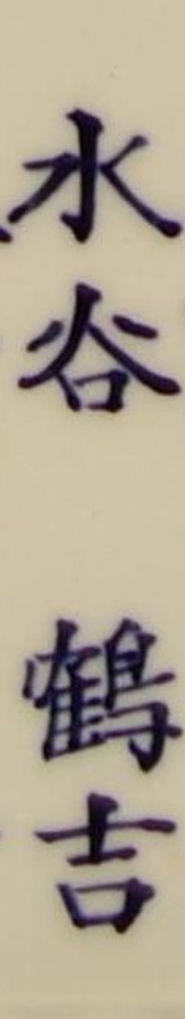水谷鶴吉
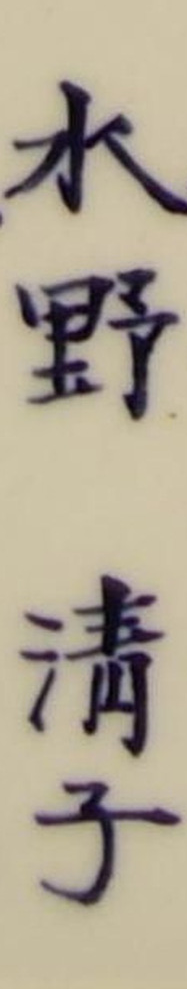水野清子
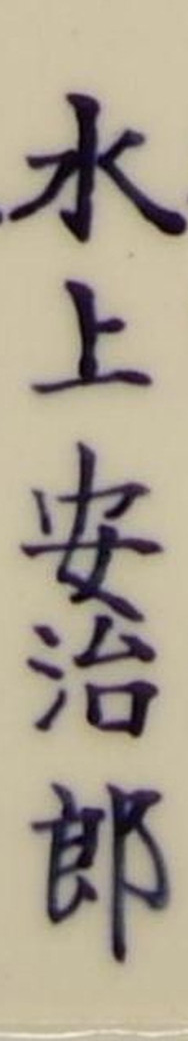水上安治郎
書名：E~L
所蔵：高野山金剛峯寺
